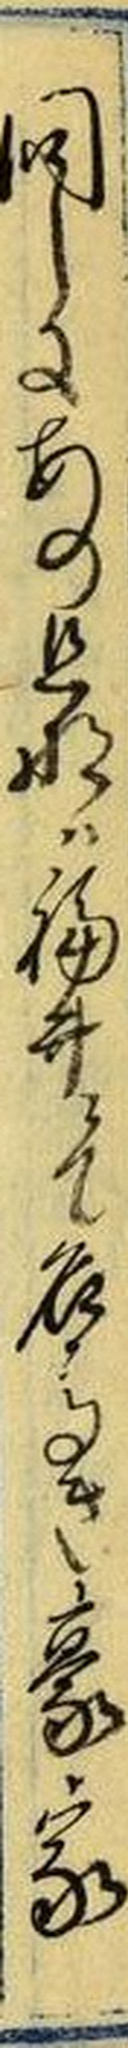問しにあの旦那ハ福井ニて名高き豪家
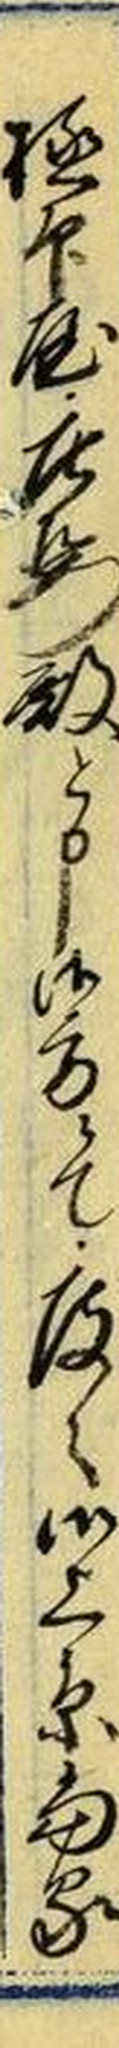極印屋庄左衛門と申御方ニて度々御上京当家
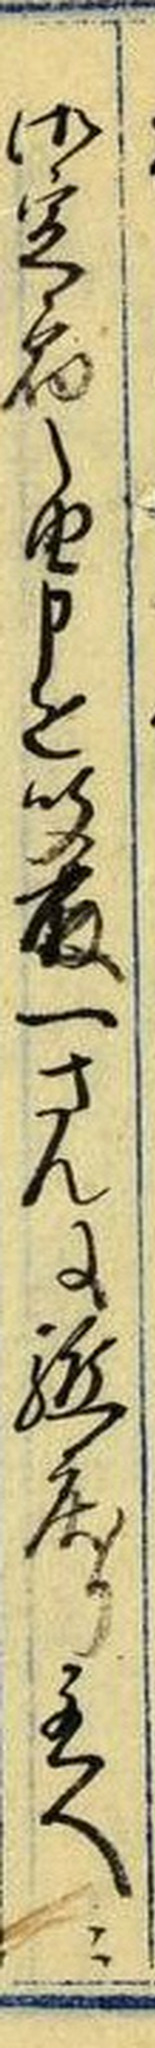御定宿之由申を聞取一さんに駆戻り主人ニ
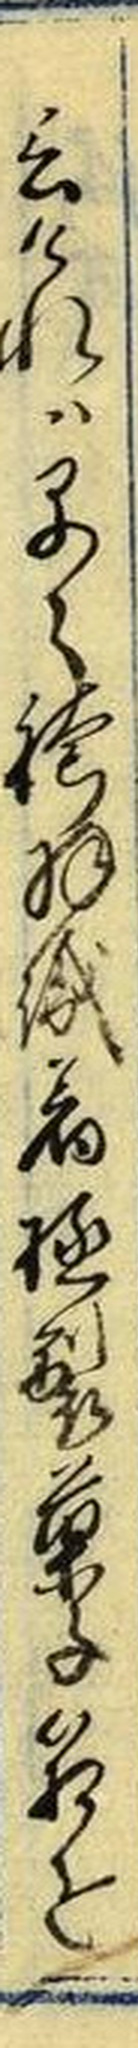云けれハ早々袴羽織着極製菓子箱を
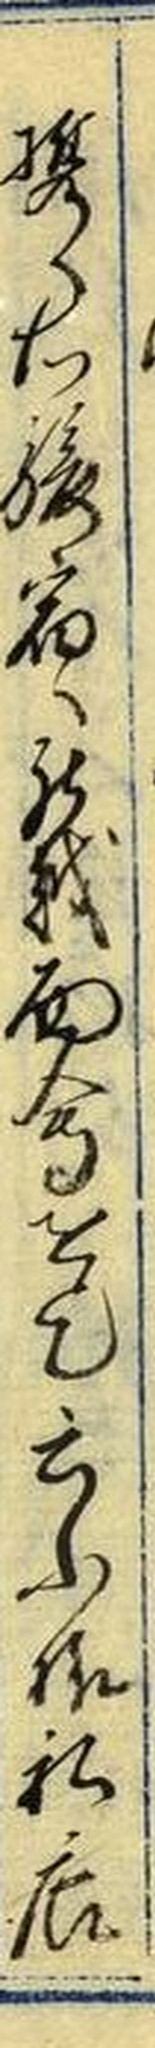携へ右旅宿へ罷越面会を乞云ふ様私店
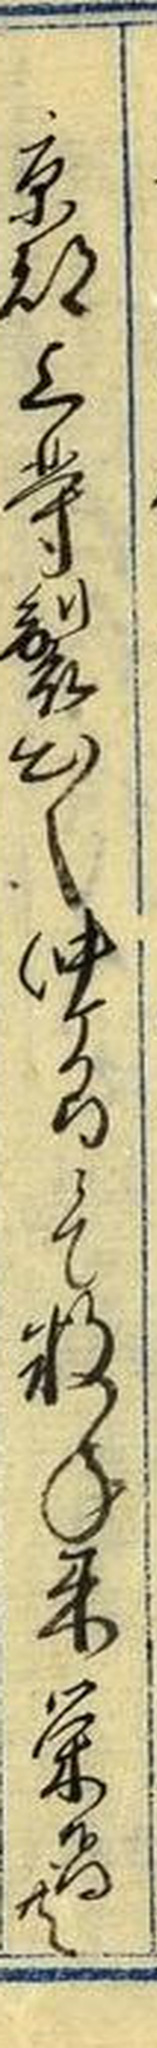京都上等製出之仲ヶ間ニて数年来栄候得共
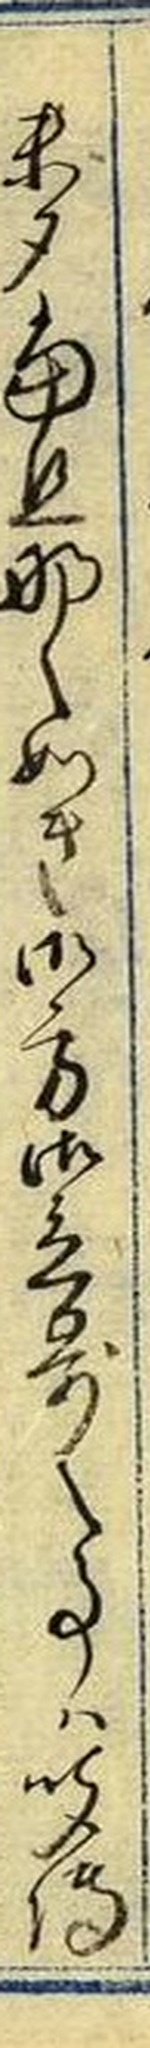未タ当旦那之如き御方御立寄之事ハ聞伝
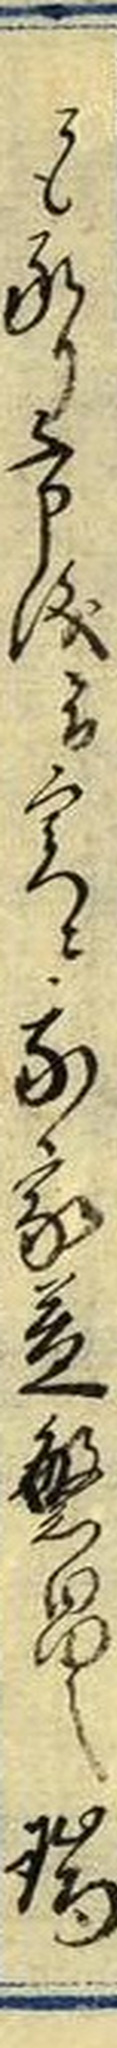ニも承り不申儀ニ而実ニ我家益繁盛之瑞
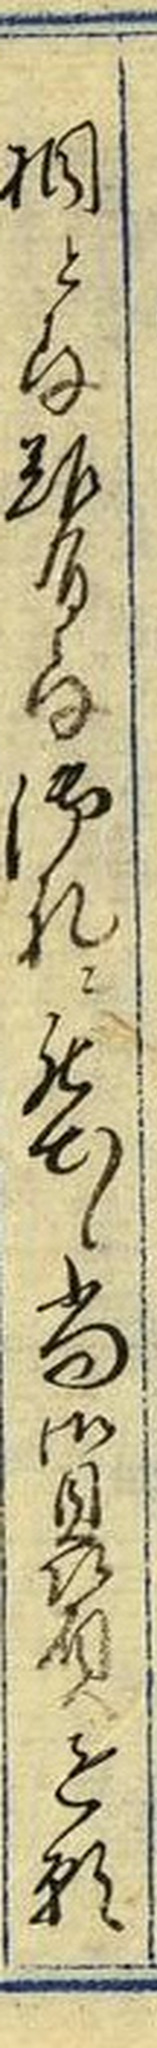相と存難有存御礼ニ罷出候尚御贔屓を願
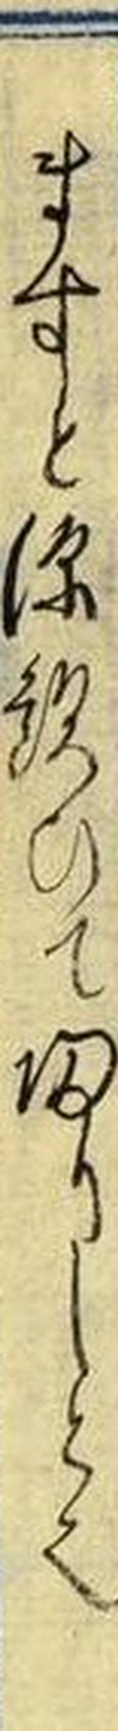ますと深額ひて帰りしと也

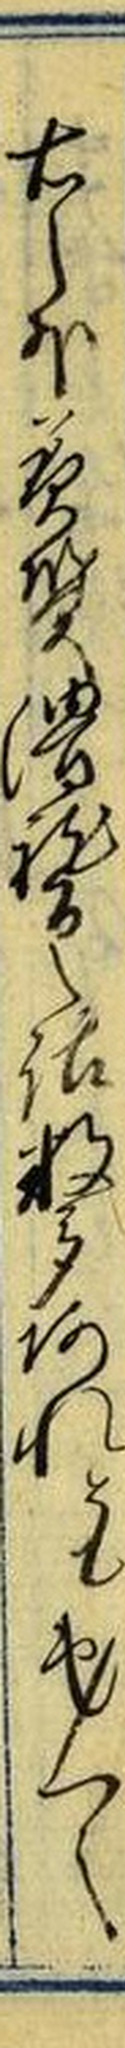右之外美質滑稽之話数多あれとも第一之
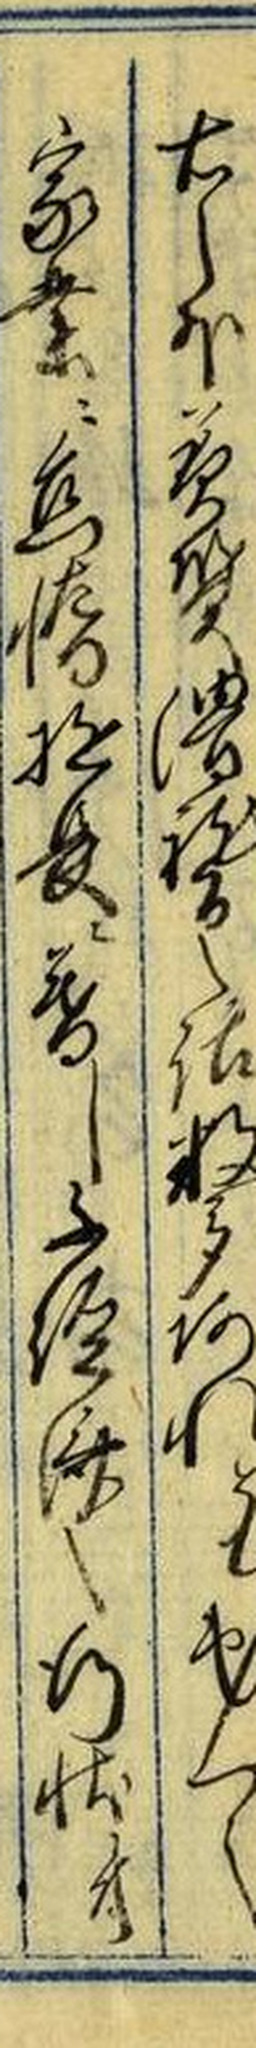家業ニ怠惰遊長ニ暮し不経済之行状ニ付
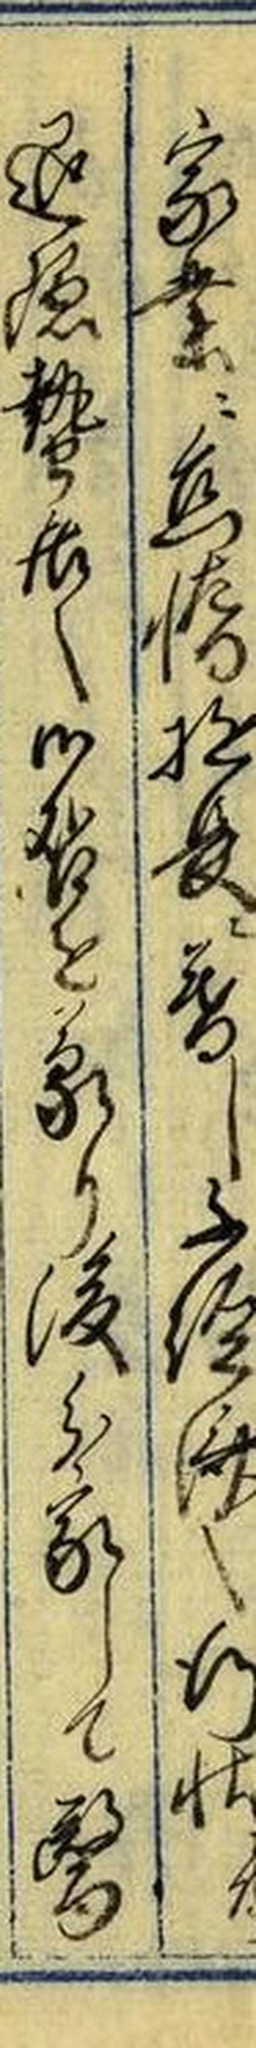退隠蟄居の御咎を蒙り後分家して医
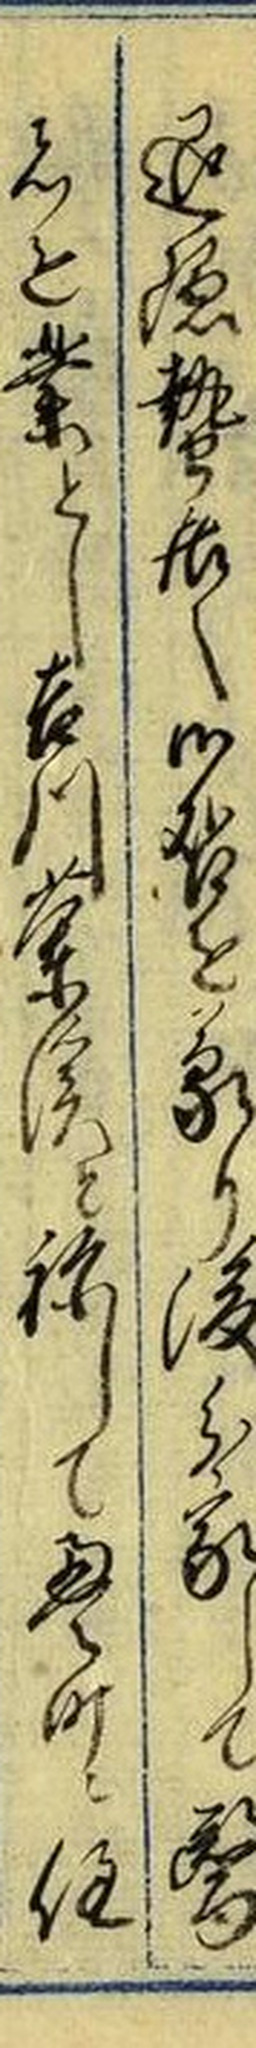者を業として吉川蘭渓と称して畳町ニ住
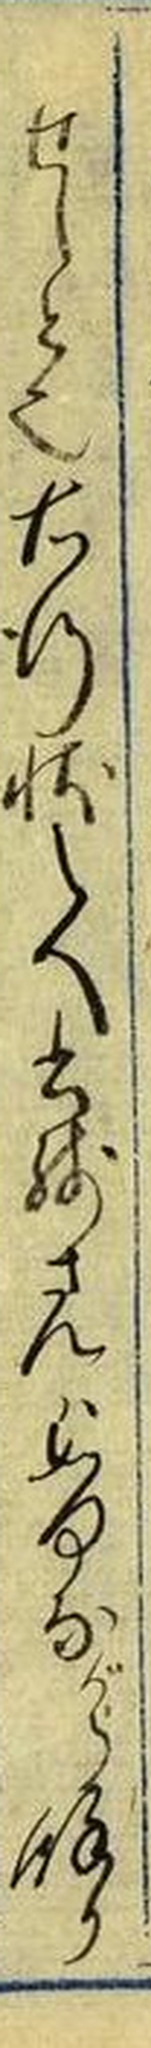せしと也右行状之人書残さんハ如何ながら餘り
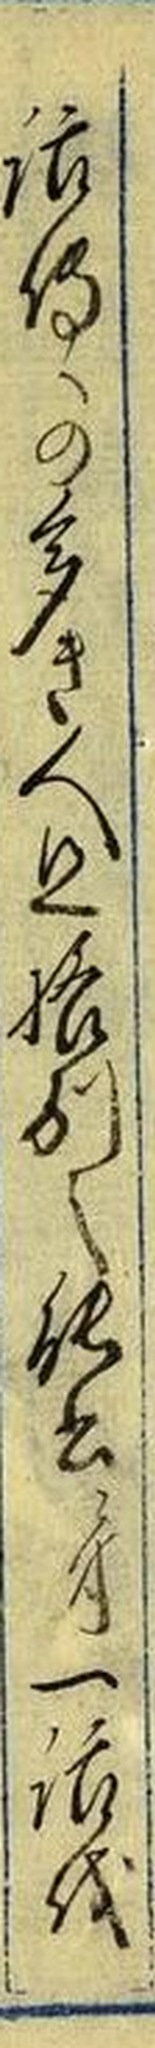話伝への多き人且格別之能書ニ付一話を
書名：温古集 三巻
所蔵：福井県文書館 Fukui Prefectural Archives
